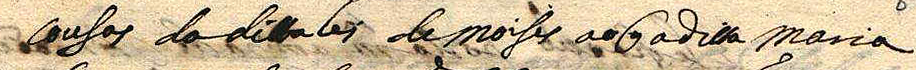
cousas da ditta lej de moises ao q̄ a ditta maria
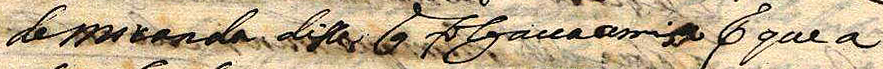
de miranda disse q̄ folgaua com isso p̄ que a
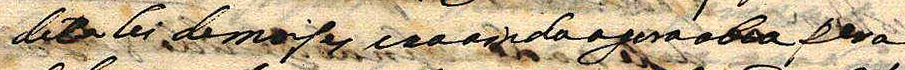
dita lei de moises era ainda agora a boa pera
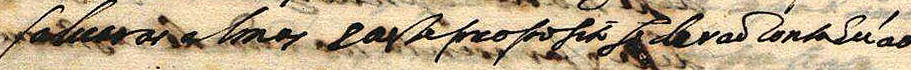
saluar as almas E a este proposito se deraõ conta hū ao
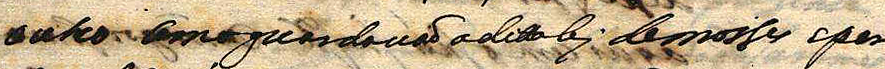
outro como guardauaõ a ditta lej de moises E por
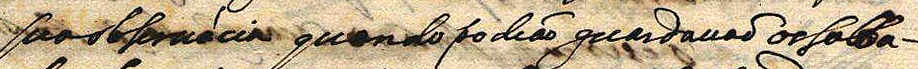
sua obseruācia quando podiaõ guardauaõ os sabba
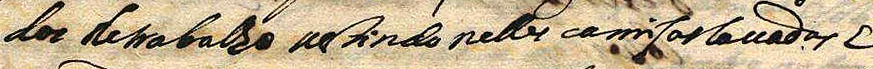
dos de trabalho uestindo nelles camisas lauadas E
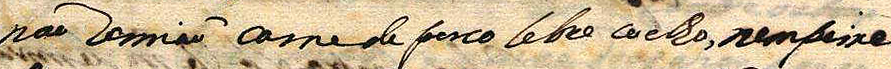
naõ comiaõ carne de porco lebre coelho, nem peixe
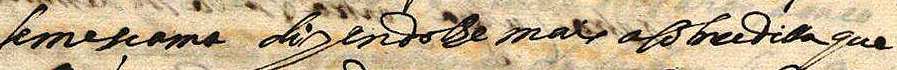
sem escama dizendolhe mais a sobreditta que
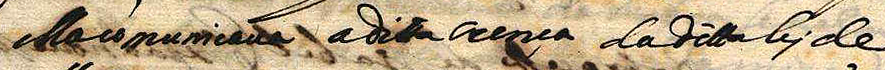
ella cōmunicaua a ditta crença da ditta lej de
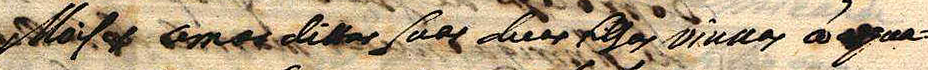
Moises com as dittas suas duas filhas viuuas cō a_ qua
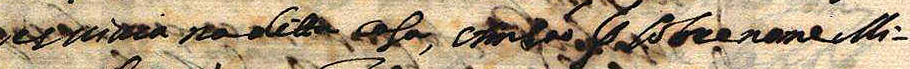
es uiuia na ditta casa, E tinhaõ p̄ sobrenome Mi
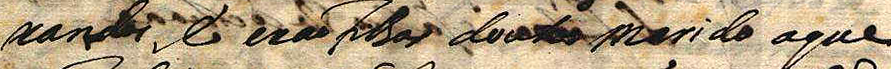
randas & eraõ filhas doutro marido a que
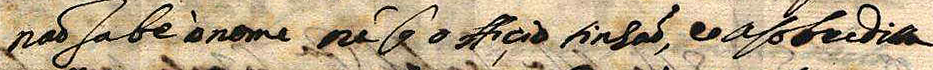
naõ sabe o nome nē q̄ offiçio tinhaõ, e a sobreditta
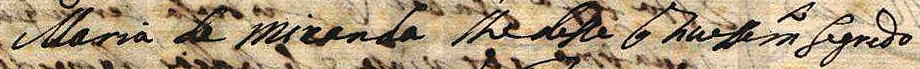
Maria de miranda lhe disse q̄ tiuesse mto segredo
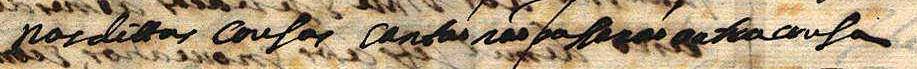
nas dittas cousas E antaõ naõ passaraõ outra cousa
